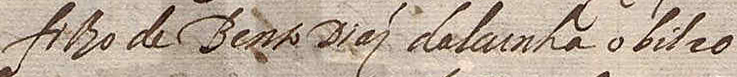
filho de Bento Diaz̄ dalcunha o bilro
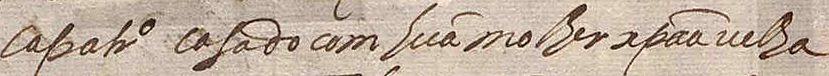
capatro casado com huā mulher xpāa uelha
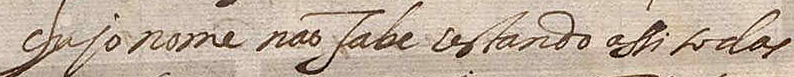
cujo nome não sabe E estando assi todas
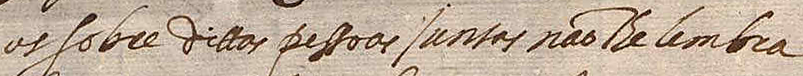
as sobre dittas pessoas Juntas não lhe lembra
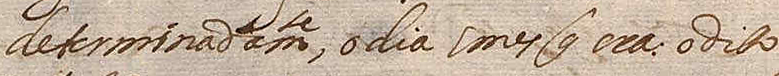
determinadamte, o dia E mes q̄ era: o ditto
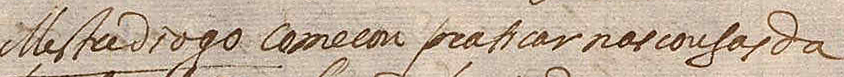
Mestre diogo comecou praticar nas cousas da
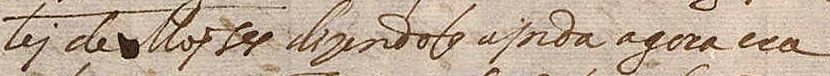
lej de Mojses dizendo q̄ ajnda agora era
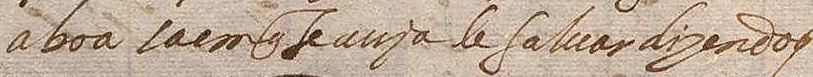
a boa E a em q̄ se auja de saluar dizendo q̄
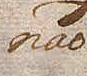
não
